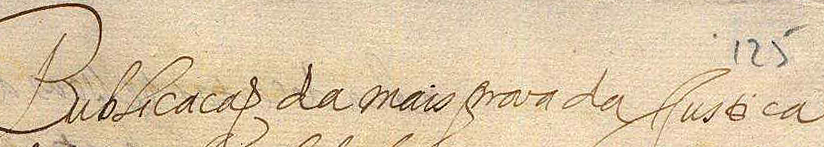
Publicacaõ da mais prova da Justica
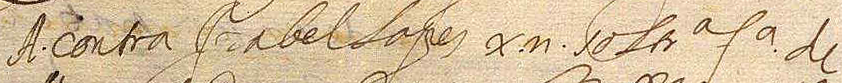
A. contra Jzabel Lopes x.n. soltra fa. de
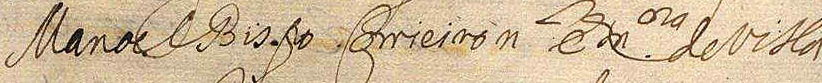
Manoel Bispo Corrieiro nl e mora. de Villa
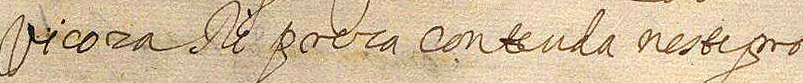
Vicoza Rè preza conteuda neste pro
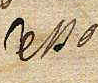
cesso
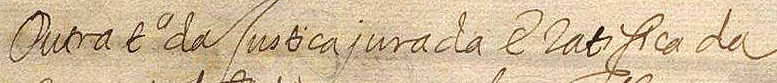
Outra ta da Justica jurada e ratificada
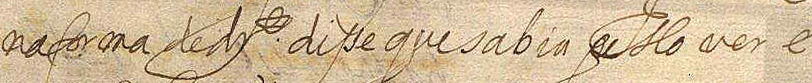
na forma de drto. disse que sabia pello ver e
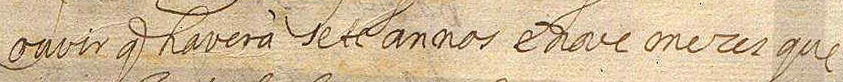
ouvir q̄ haverà sete annos e nove mezes que
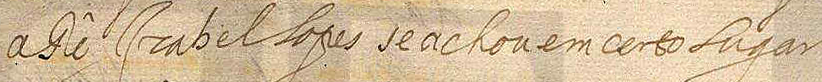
a Rè Jzabel lopes se achou em certo lugar
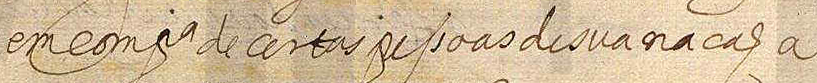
em compa de certas pessoas de sua nacaõ a
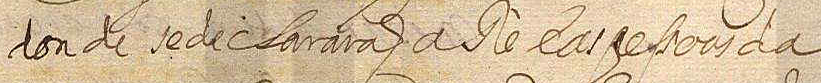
donde se declararaõ a Rè e as pessoas da
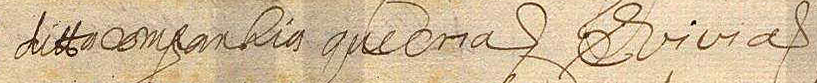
ditta companhia que criaõ e viviaõ
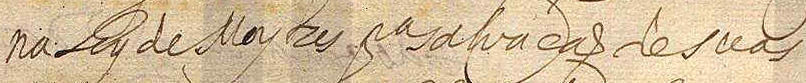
na Ley de Moyzes pa salvacaõ de suas
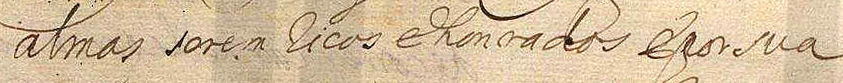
almas, serem Ricos e honrados e por sua
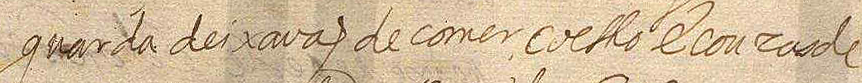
guarda deixavaõ de comer coelho e couzas de
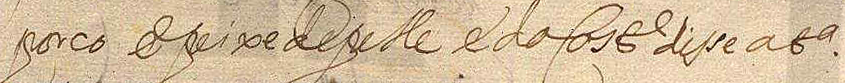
porco e peixe de pelle e do Coste disse a ta.
